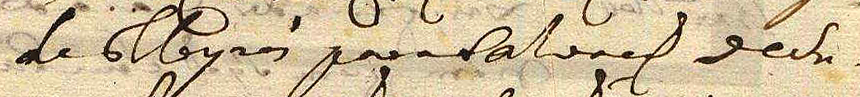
de Moyzés para salvaçaõ de sua
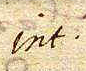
int.
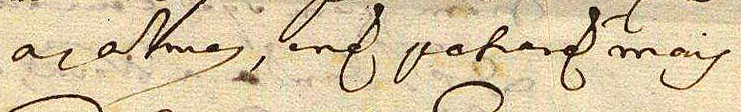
as almas, e naõ passaraõ mais
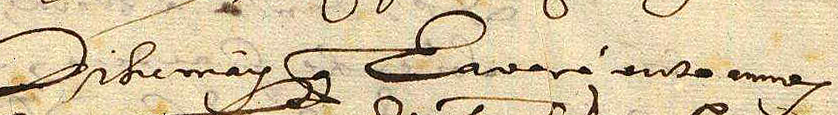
Disse mais q̄ haverá outo annos
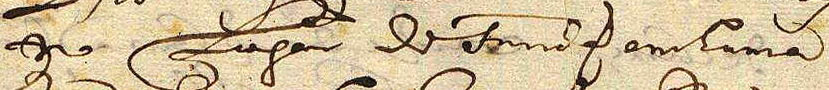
no Lugar do Fundaõ em huma
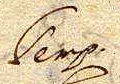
Temp.
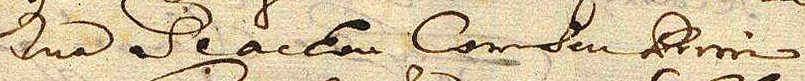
Rua Se achou Com Seu Primo
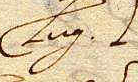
Lug. L.
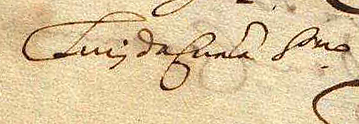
Luis da Cunha Pmo.
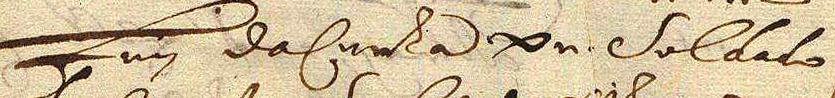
Luis da Cunha xn. Soldado
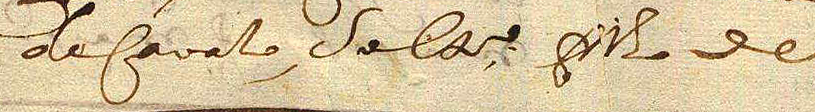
de Cavalo, Soltr.o, filho de
